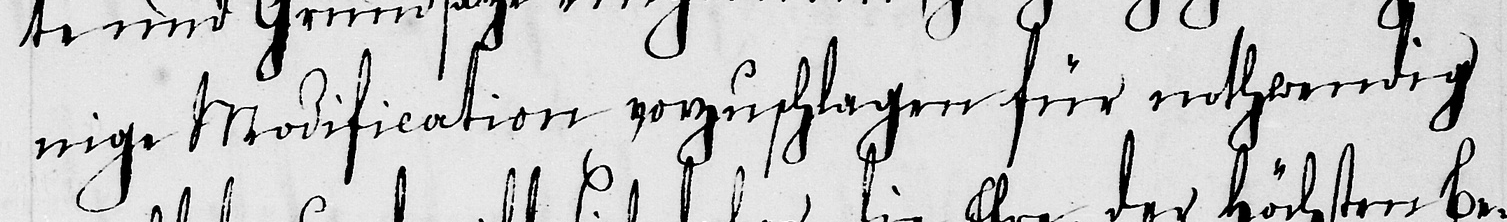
nige Modificationen vorzuschlagen für nothwendig
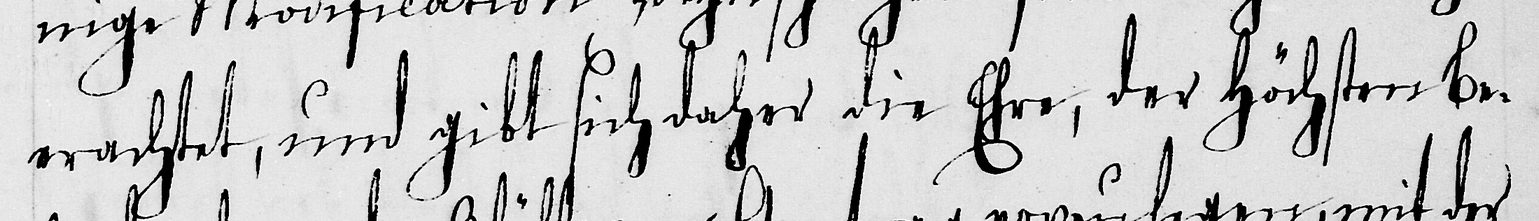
erachtet, und gibt sich daher die Ehre, der höchsten Be¬
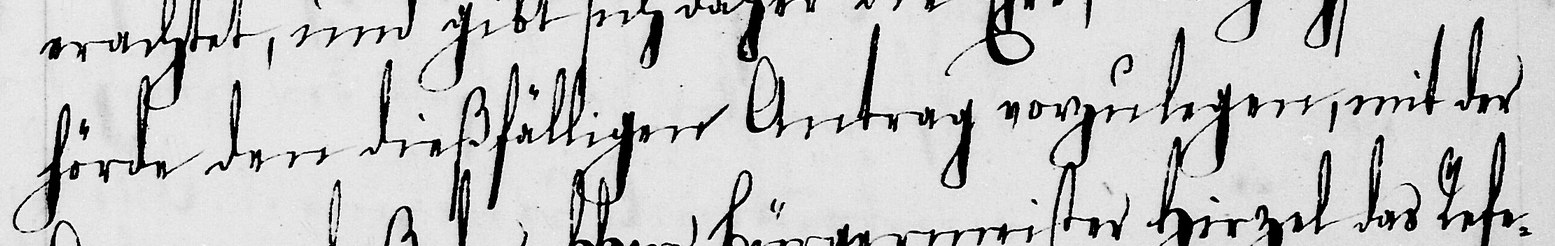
hörde den dießfälligen Antrag vorzulegen, mit der
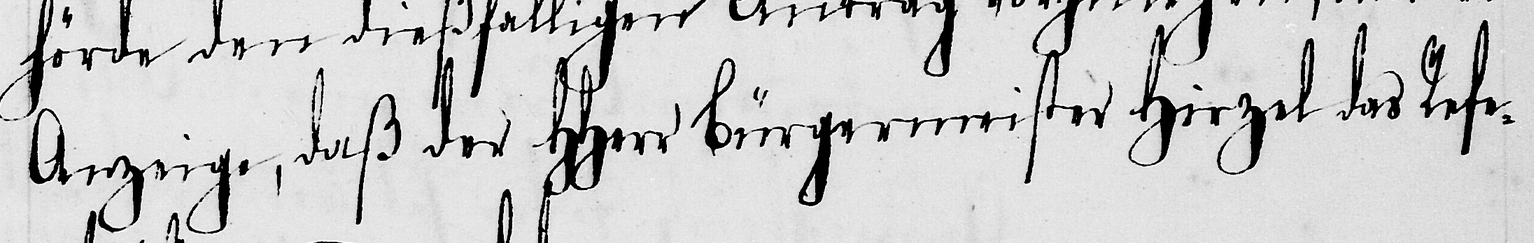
Anzeige, daß der HHerr Bürgermeister Hirzel das Refe¬
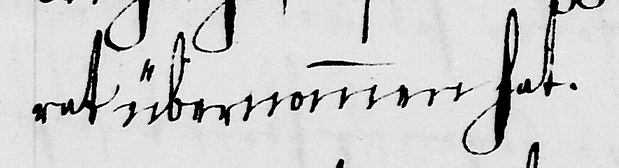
rat übernommen hat.
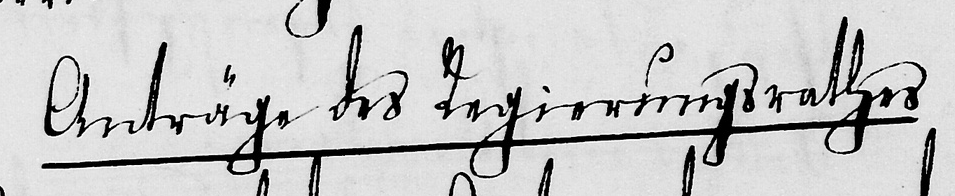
Anträge des Regierungsrathes
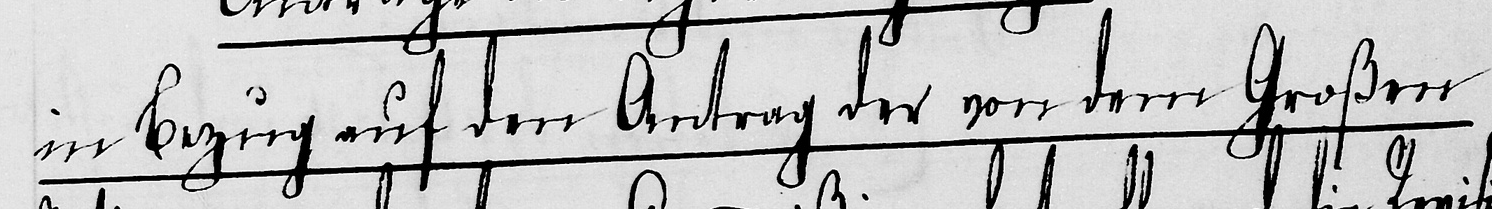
in Bezug auf den Antrag der von dem Großen
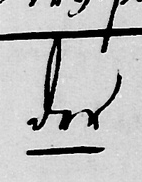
der
